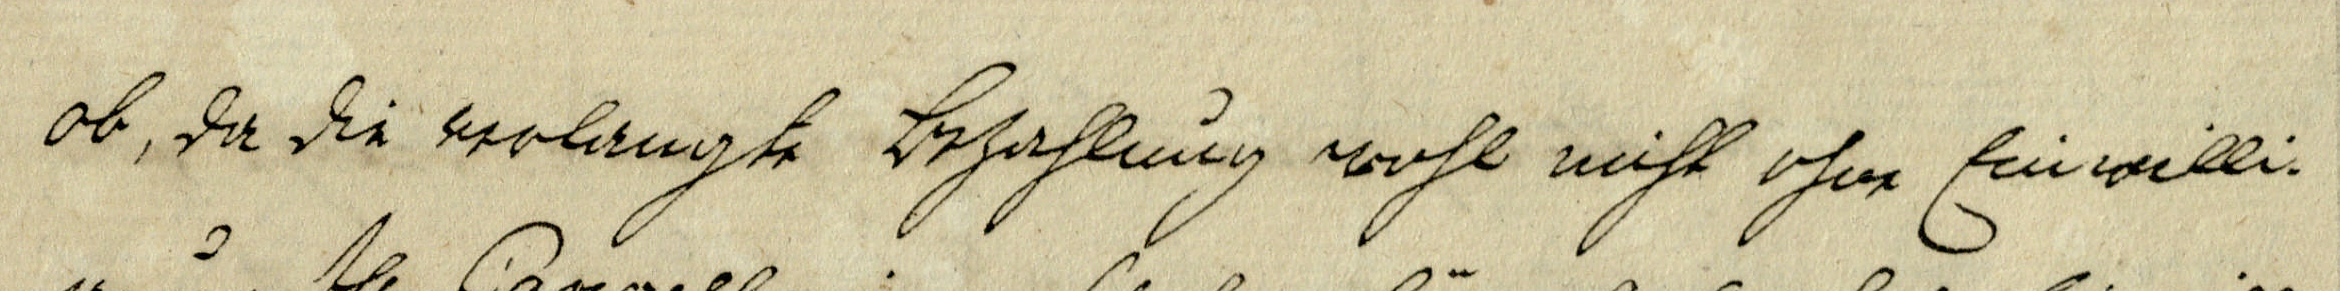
ob, da die verlangte Bezahlung wohl nicht ohne Einwilli¬
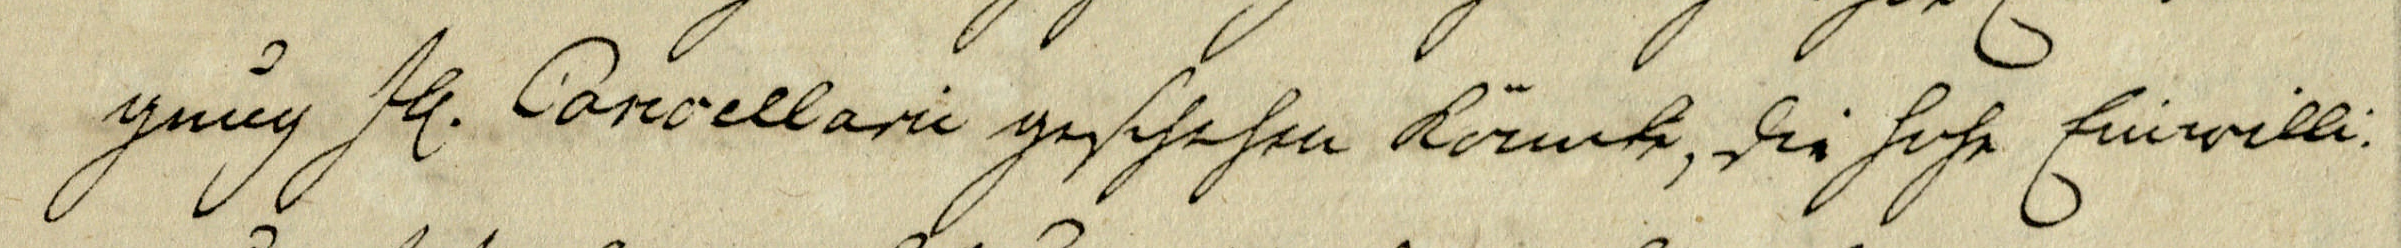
gung Ill. Cancellarii geschehen könnte, die hohe Einwilli¬
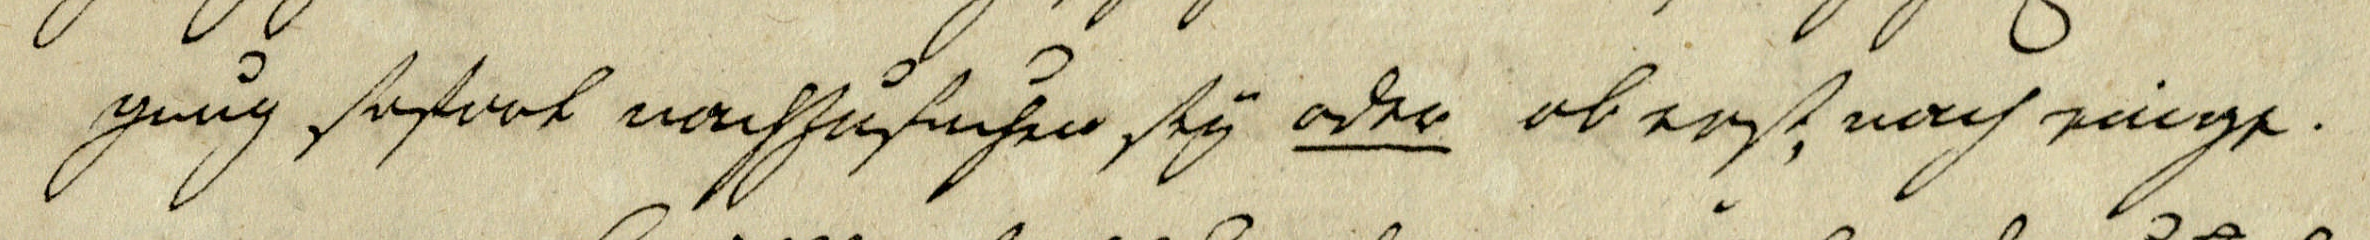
gung sofort nachzusuchen seÿ oder ob erst, nach einge¬
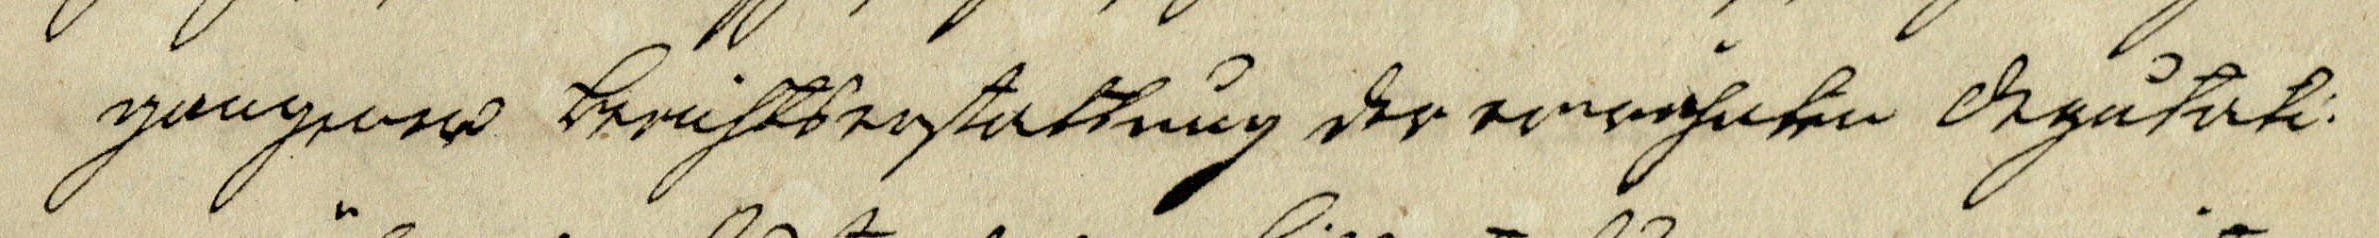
gangener Berichtserstattung der erwähnten Deputati¬
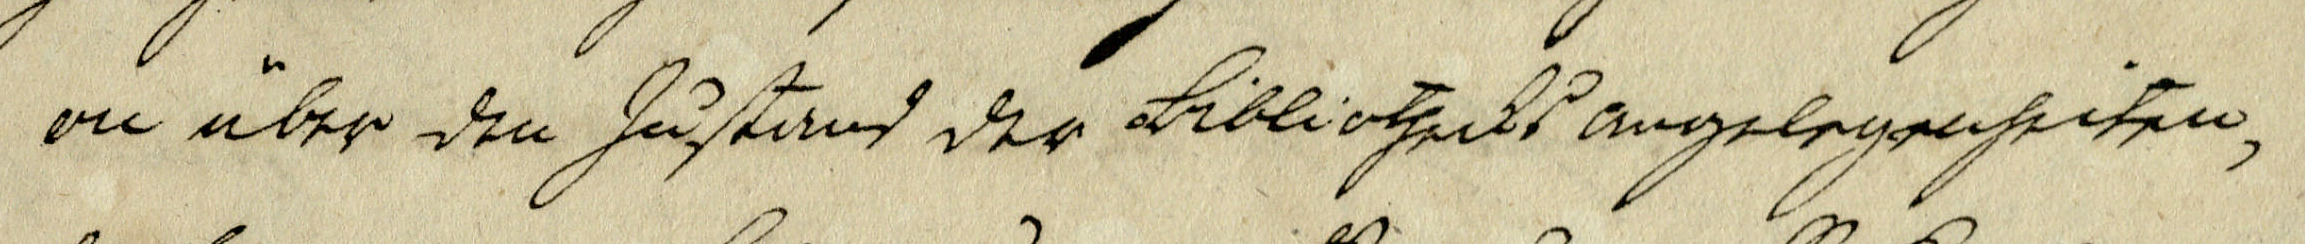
on über den Zustand der Bibliothecksangelegenheiten,
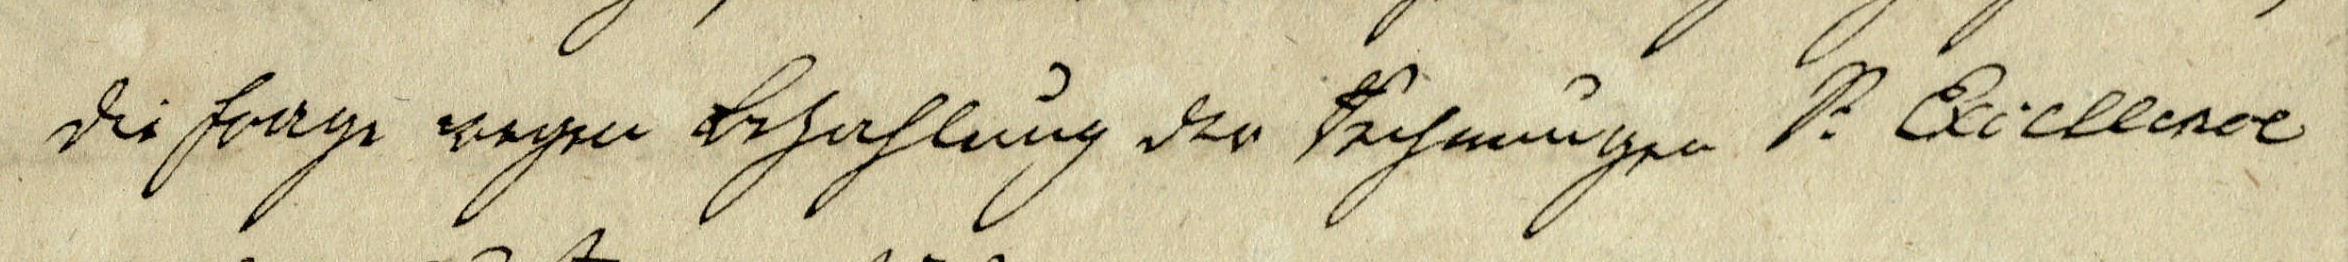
die Frage wegen Bezahlung der Rechnungen Sr Excellence
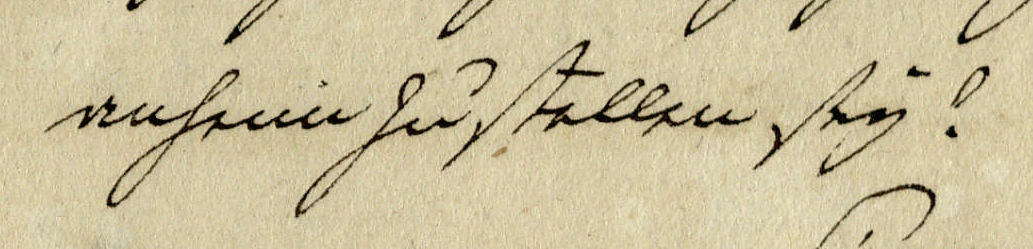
anheim zu stellen seÿ?
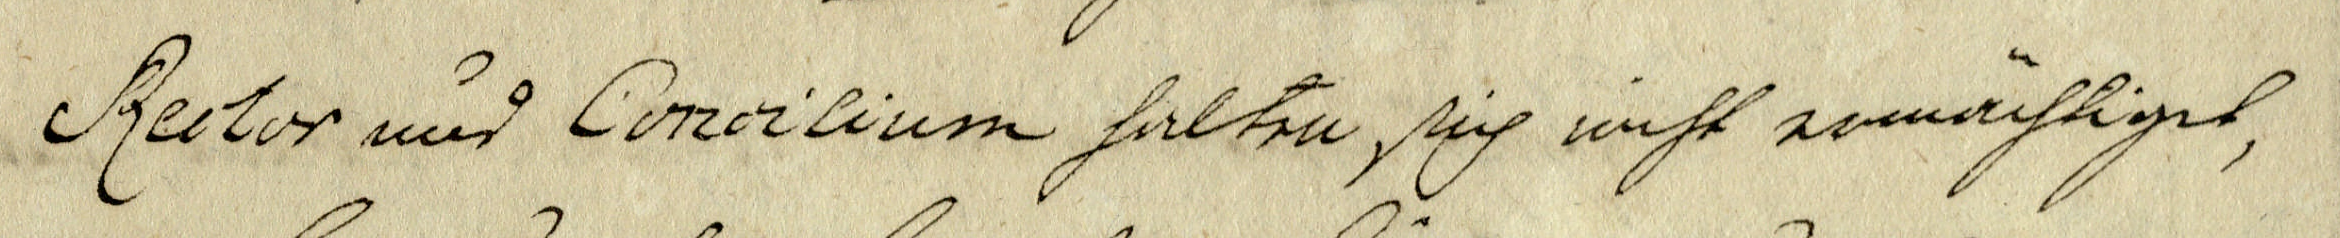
Rector und Concilium halten sich nicht ermächtiget,
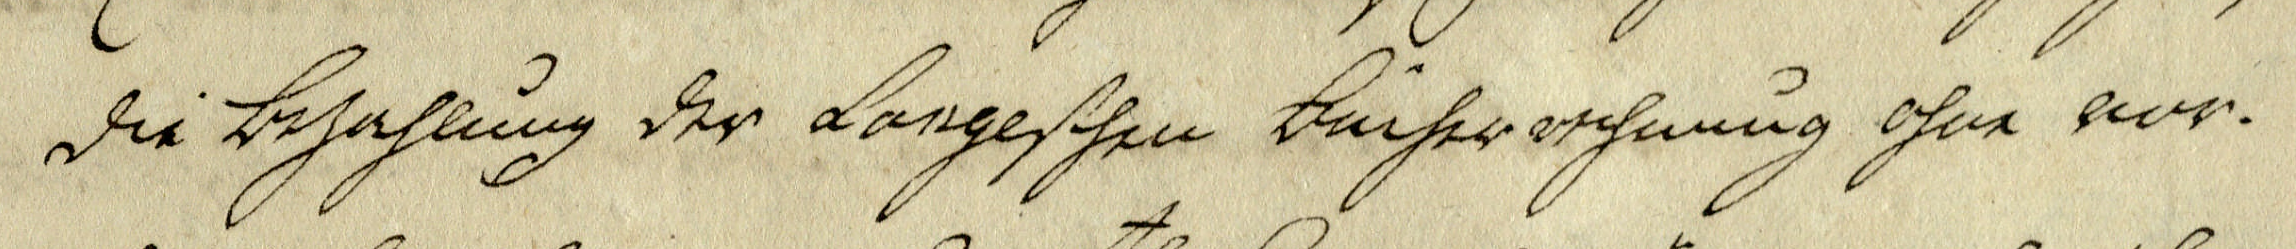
die Bezahlung der Langischen Bücherrechnung ohne vor¬
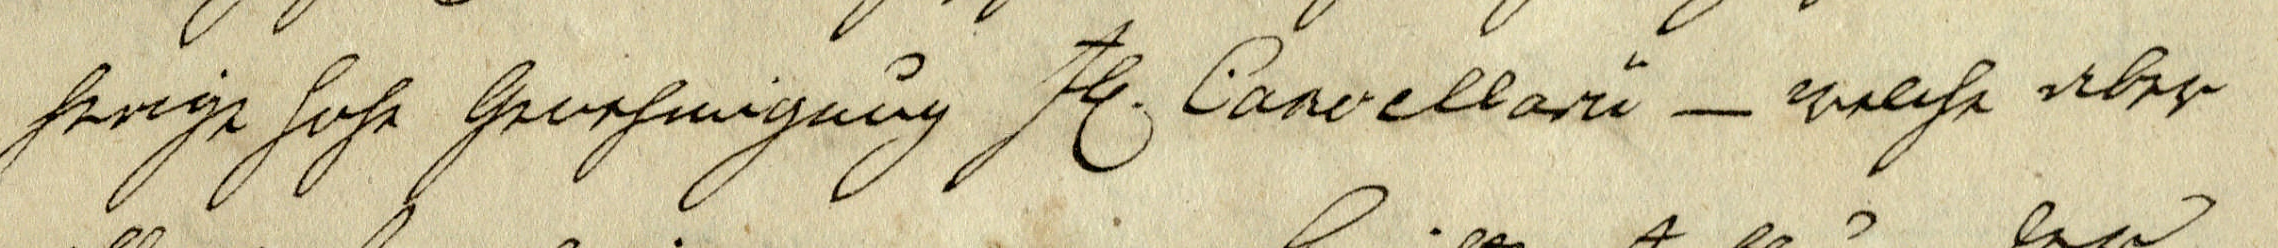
herige hohe Genehmigung Ill. Cancellarii - welche aber
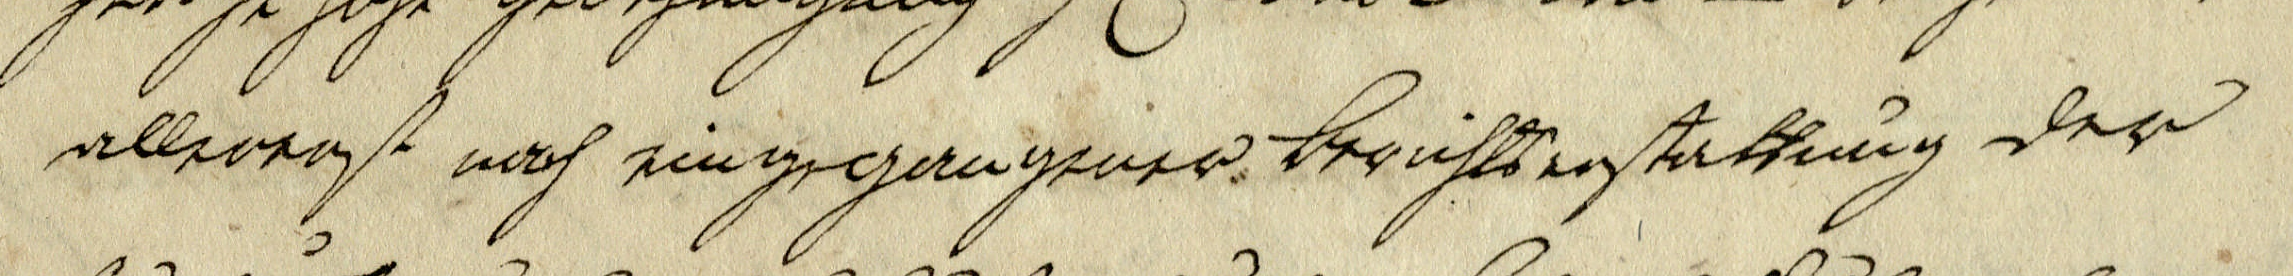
allererst nach eingegangener Berichtserstattung der
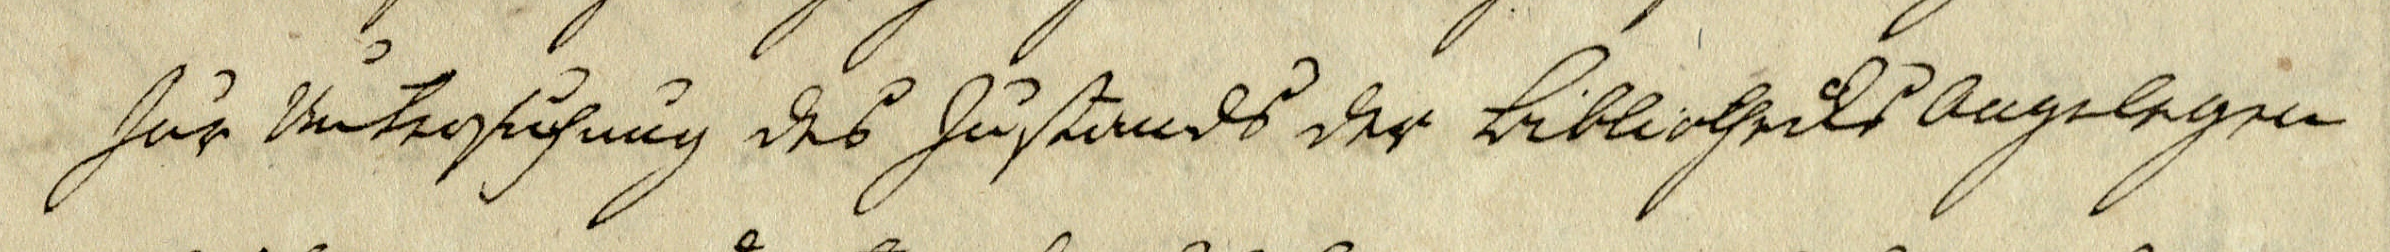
zur Untersuchung des Zustandes der Bibliotheck Angelegen¬
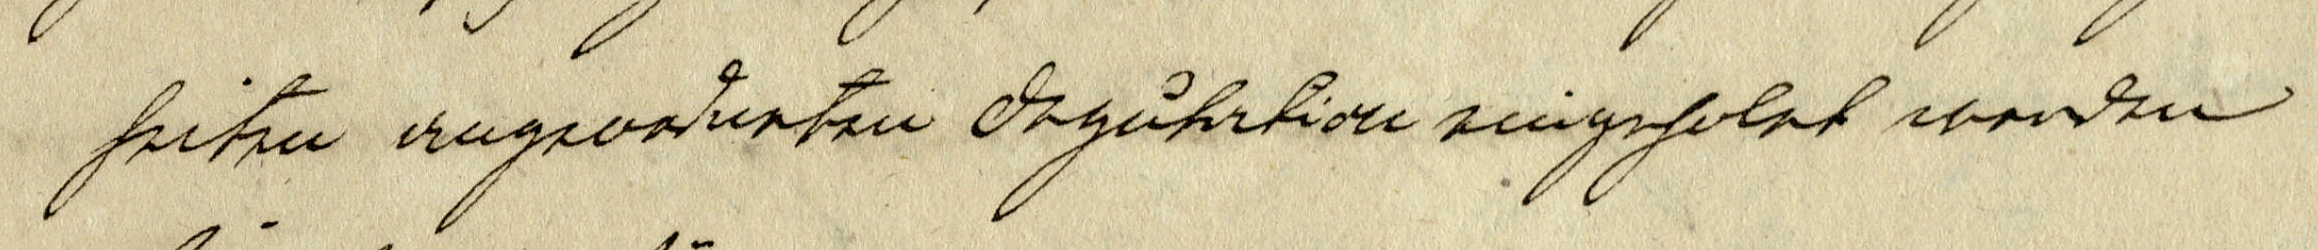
heiten angeordneten Deputation eingeholet werden
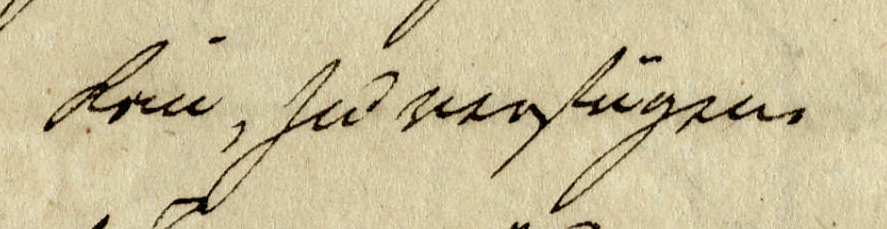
kan, zu verfügen.
